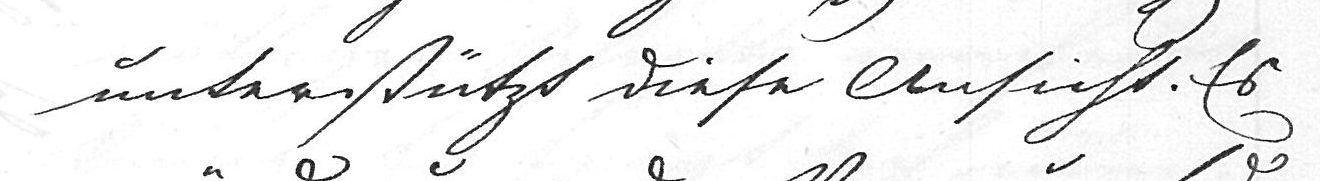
unterstützt diese Ansicht. Es
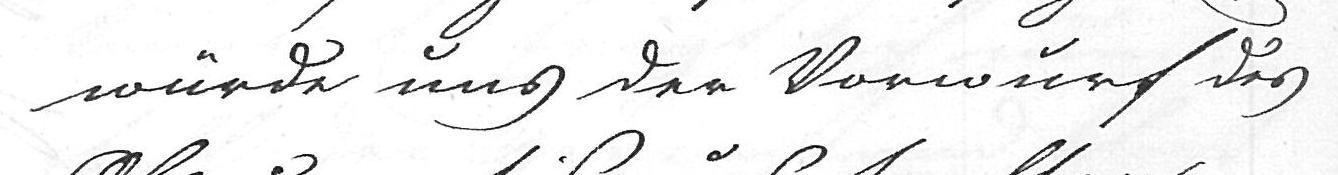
würde uns der Vorwurf des
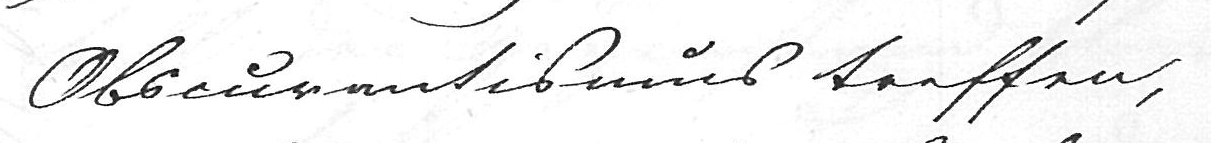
Obscurantismus treffen,
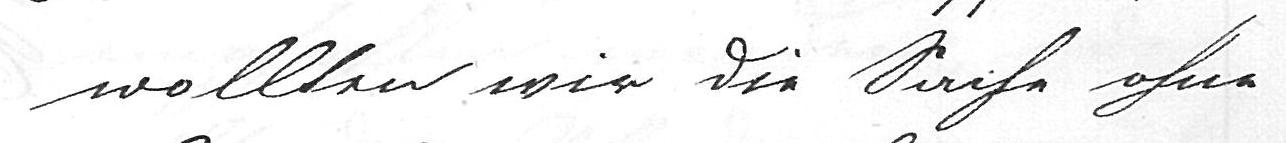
wollten wir die Sache ohne
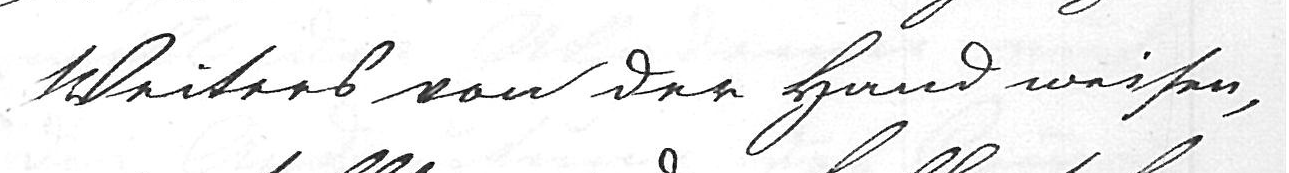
Weiteres von der Hand weisen,
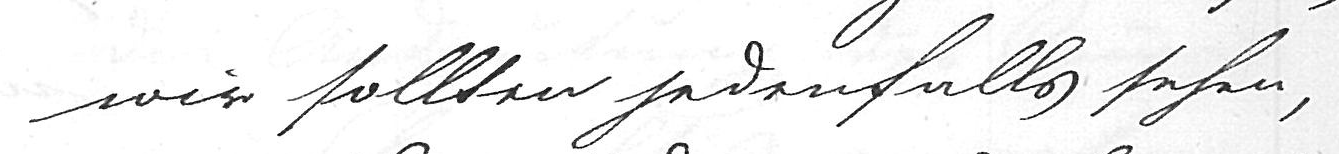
wir sollten jedenfalls sehen,
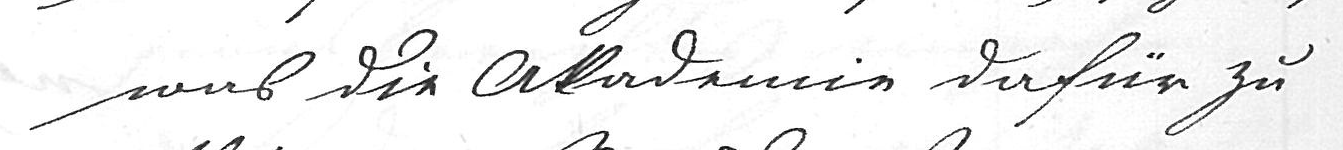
was die Akademie dafür zu
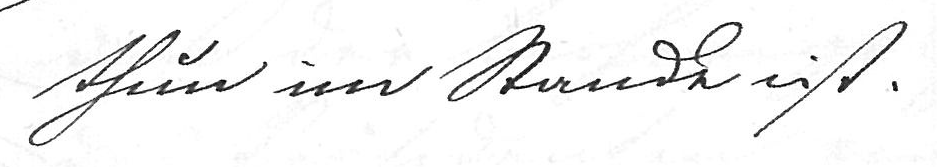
thun im Stande ist.
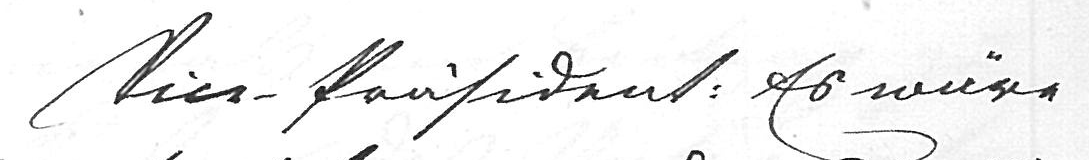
Vice-Präsident: Es wäre
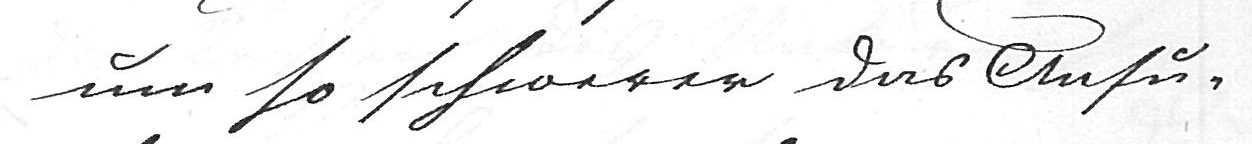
um so schwerer das Ansu-
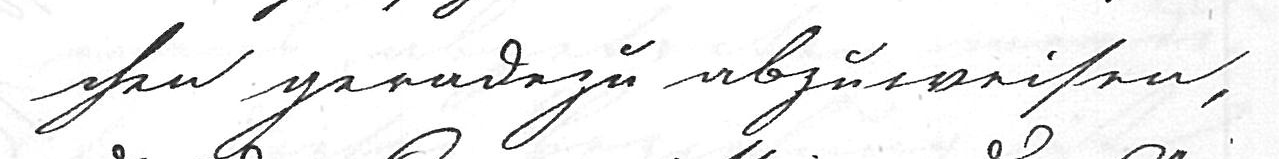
chen geradezu abzuweisen,
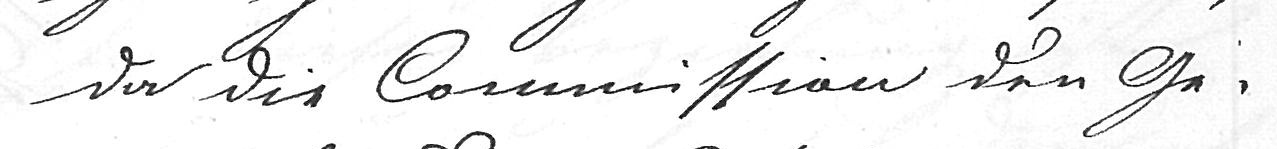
da die Commission der Ge-
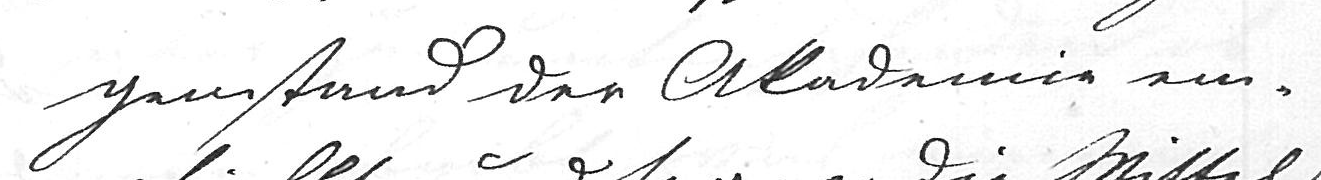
genstand der Akademie em-
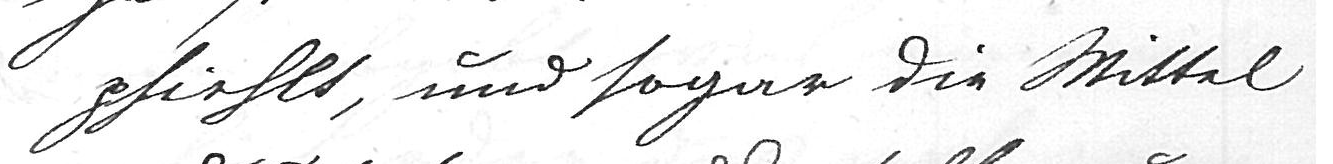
phiehlt, und sogar die Mittel
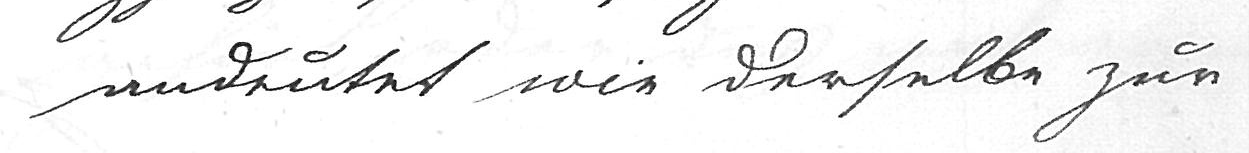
andeutet wie derselbe zur
